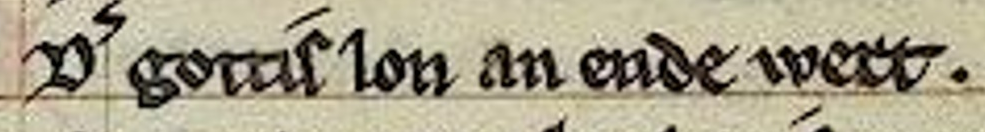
D(er) gottiſ lon an ende wert.
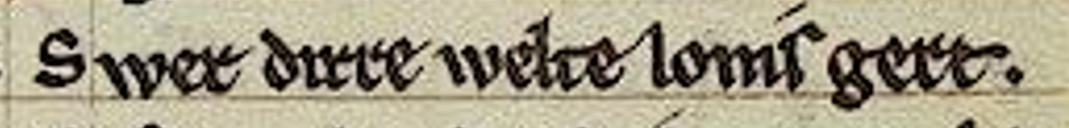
Swer dirre welte loniſ gert.
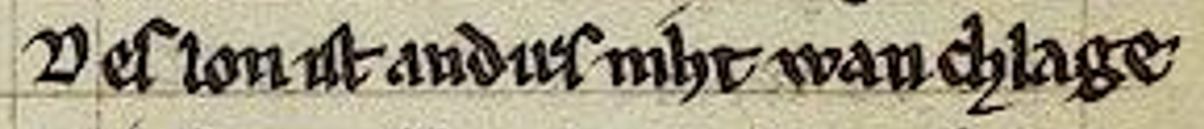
Deſ lon iſt andirſ niht wan chlage
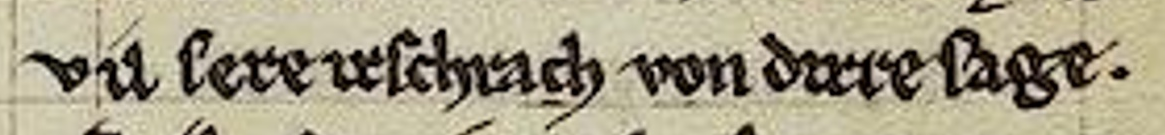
Vil ſere irſchrach von dirre ſage.
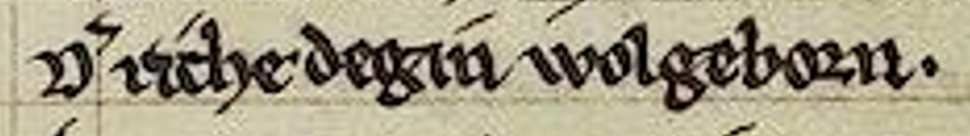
D(er) riche degin wolgeborn.
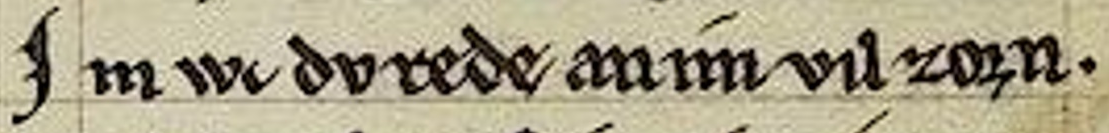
Im w(az) dv rede an im vil zorn.
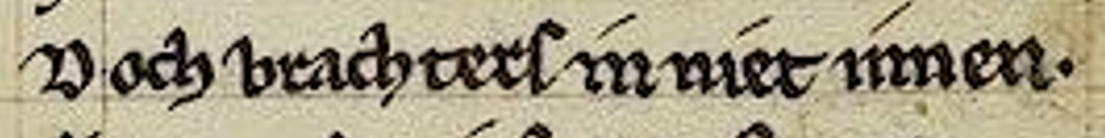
Doch brachterſ in niet innen.
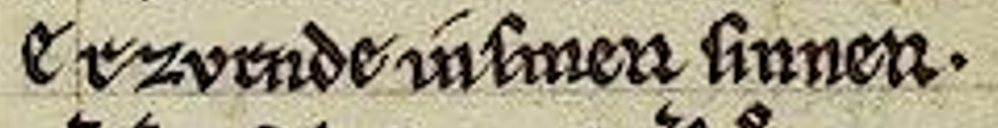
Er zvrnde in ſinen ſinnen.
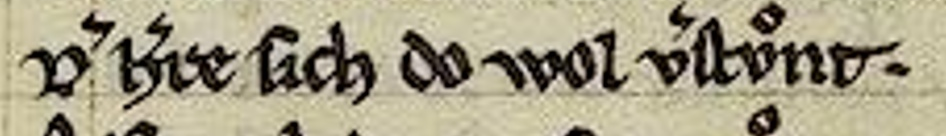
D(er) h(er)re ſich do wol v(er)ſtv°ont.
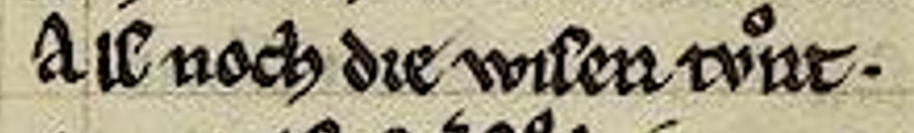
Alſ noch die wiſen tv°ont.
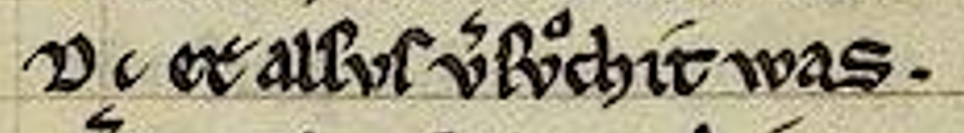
D(az) er alſvſ v(er)ſv°ochit was.
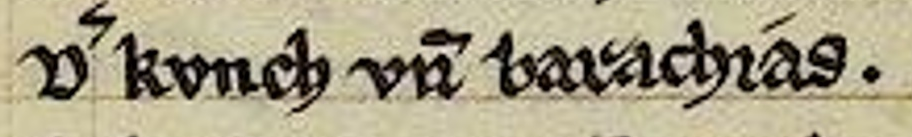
D(er) kvnch vn(d) barachias.
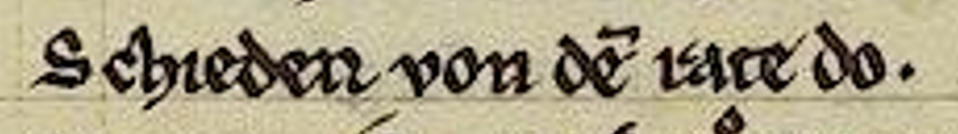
Schieden von de(m) rate do.
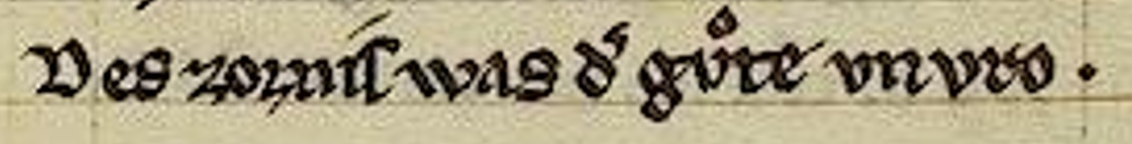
Des zorniſ was d(er) gv°ote vnvro.
